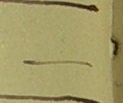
-
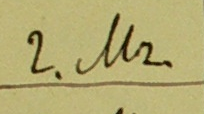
2. Mr.
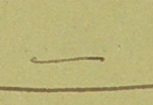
-
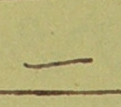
-
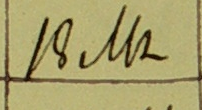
18. Mr.
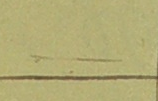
-
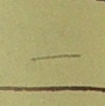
-
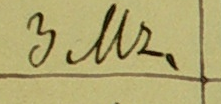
3. Mr.
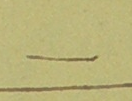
-
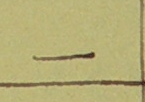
-
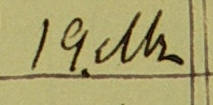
19. Mr.
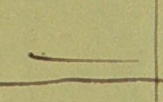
-
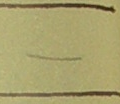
-
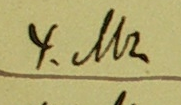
4. Mr.
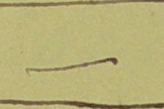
-
